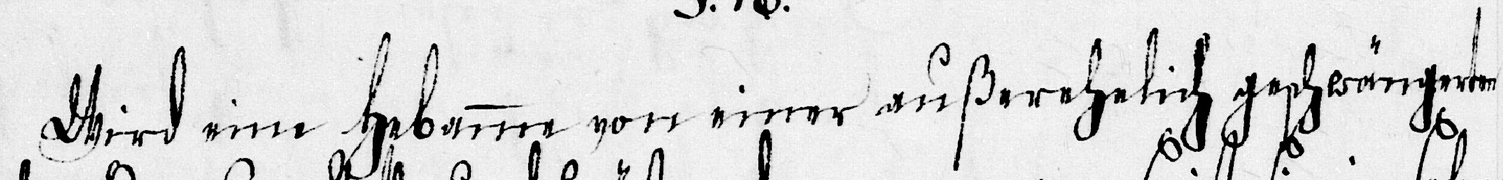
Wird eine Hebamme von einer außerehelich geschwängerten
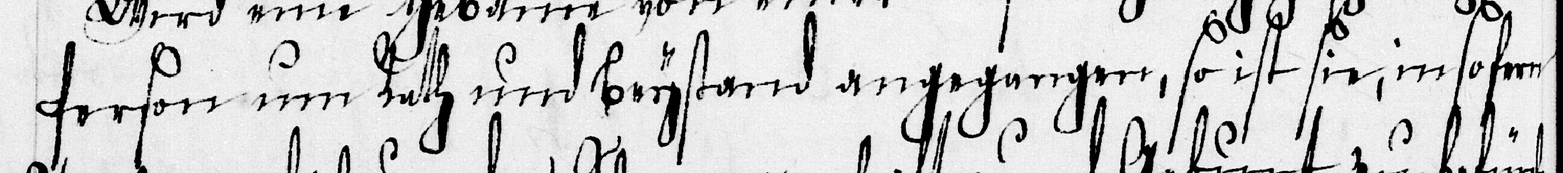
Person um Rath und Beystand angegangen, so ist sie, in sofern
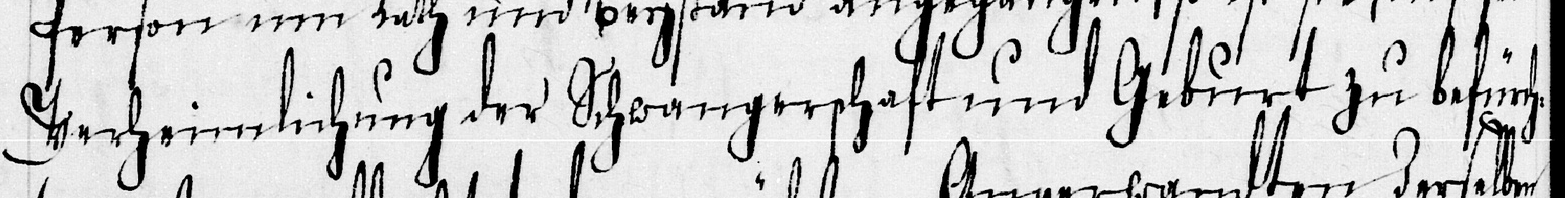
Verheimlichung der Schwangerschaft und Geburt zu befürc¬
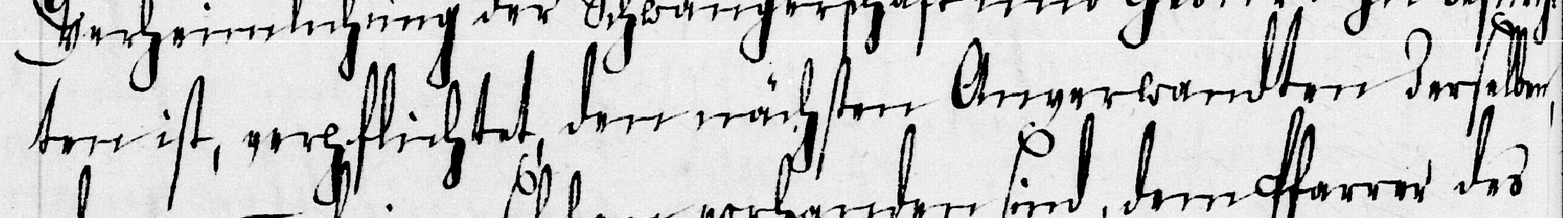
hten ist, verpflichtet, den nächsten Anverwandten derselb¬
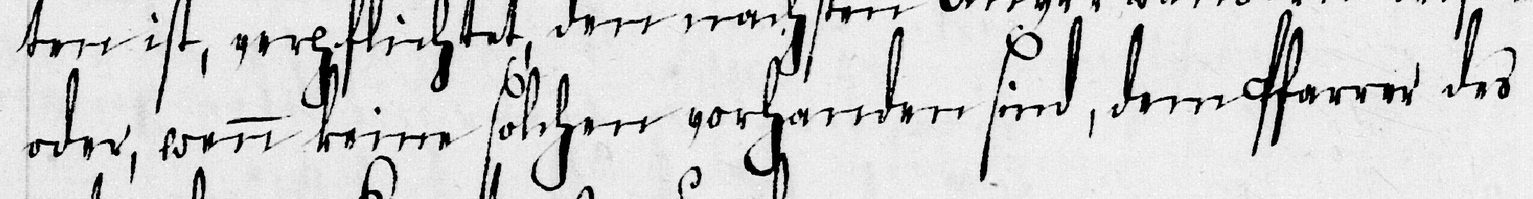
oder wenn keine solchen vorhanden sind, dem Pfarrer des
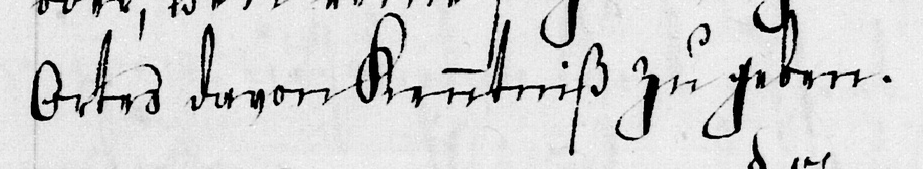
Ortes davon Kenntniß zu geben.
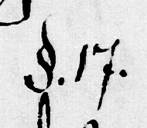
§. 17.
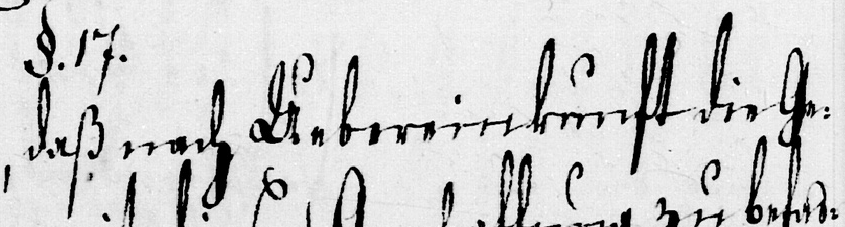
daß nach Uebereinkunft die G¬
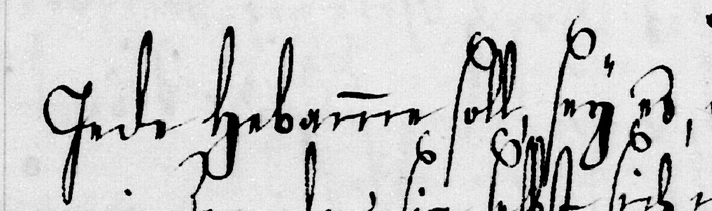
Jede Hebamme soll, sey
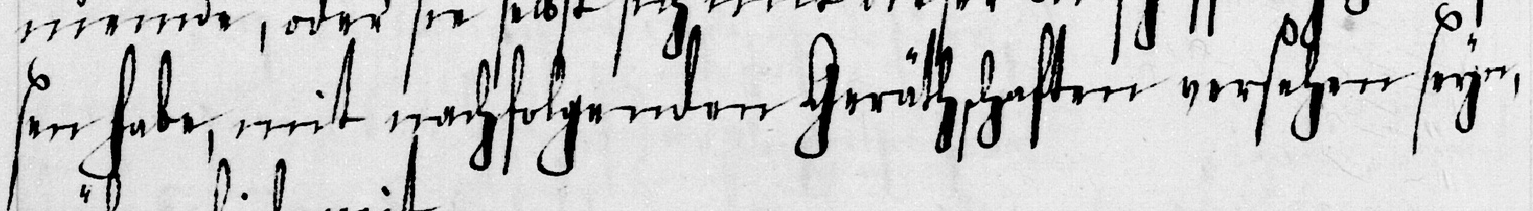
ßen habe, mit nachfolgenden Geräthschaften versehen seyn,
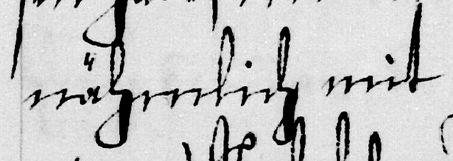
nähmlich mit
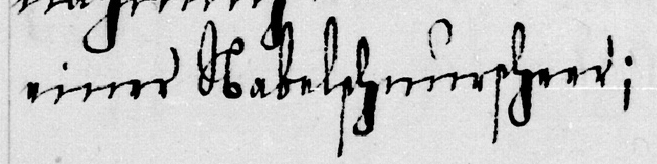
einer Nabelschnurscheer;
